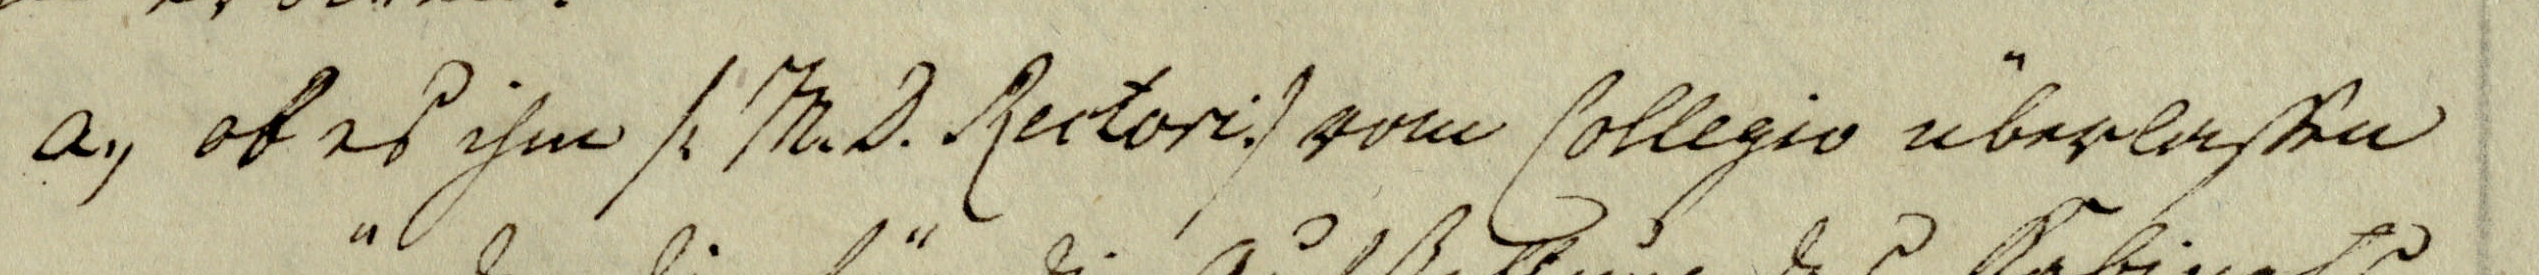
a., ob es ihm /: M. D. Rectori ./ vom Collegio überlassen
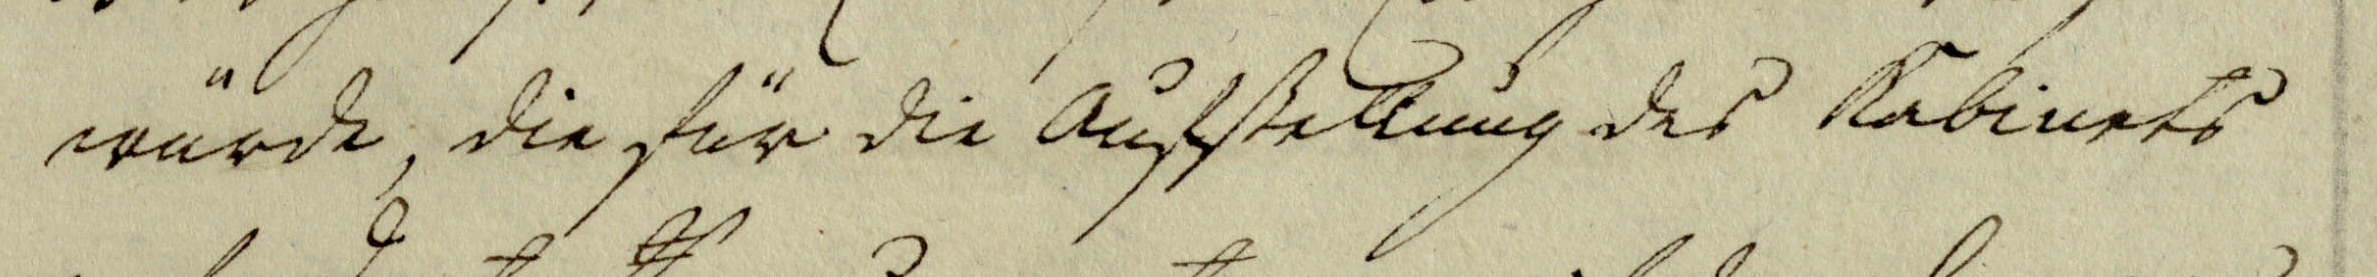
würde, die für die Aufstellung des Kabinets
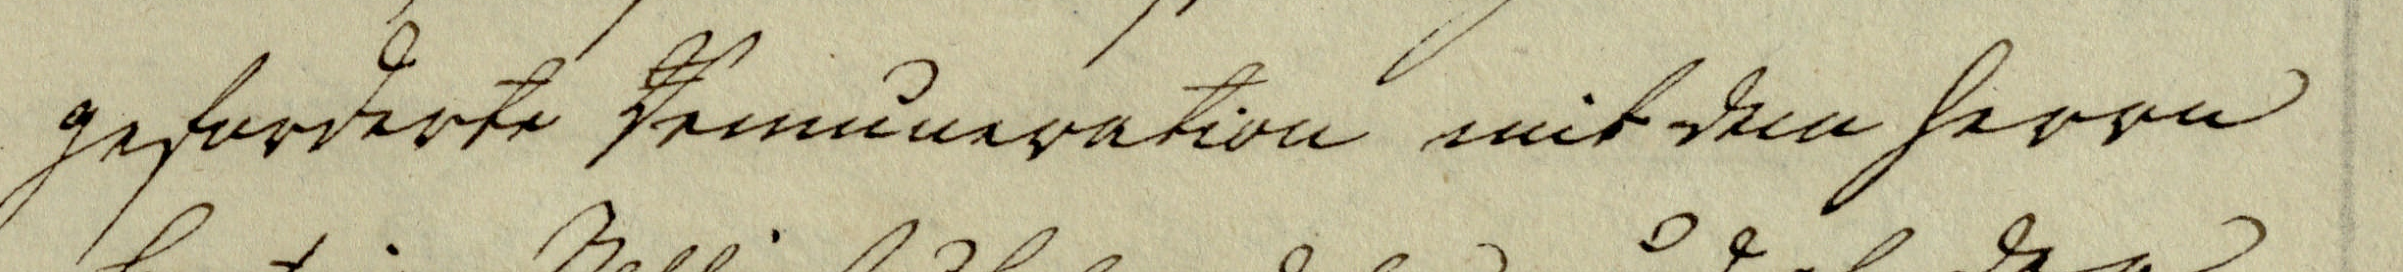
geforderte Remuneration mit dem Herrn
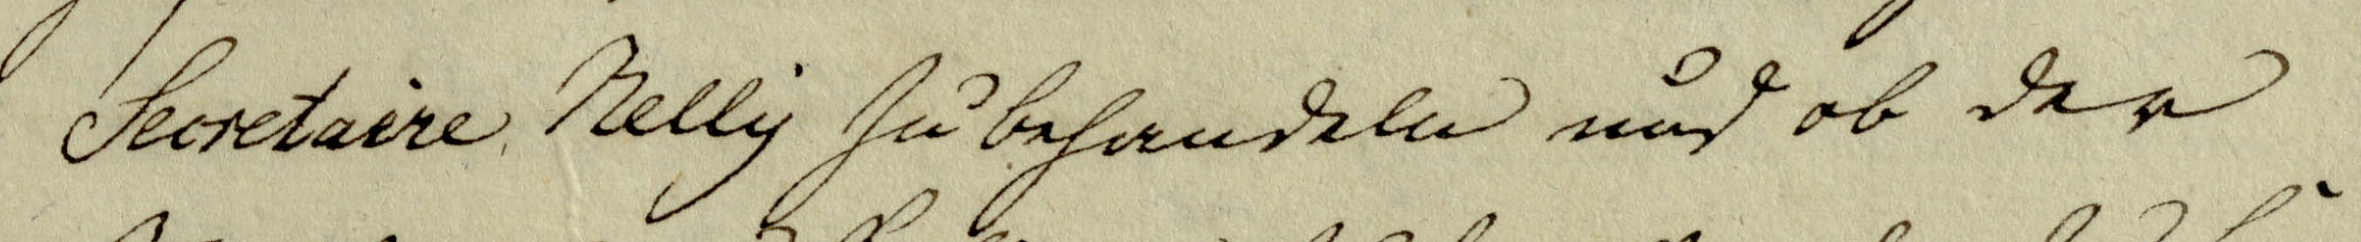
Secretaire Nellÿ zu behandeln und ob der
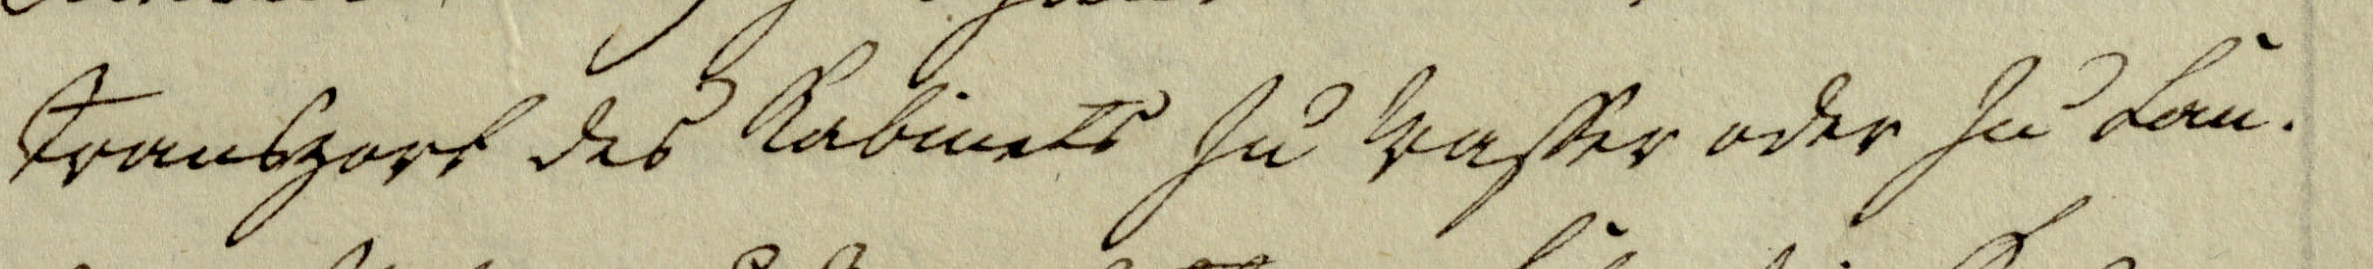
Transport des Kabinets zu Wasser oder zu Lan¬
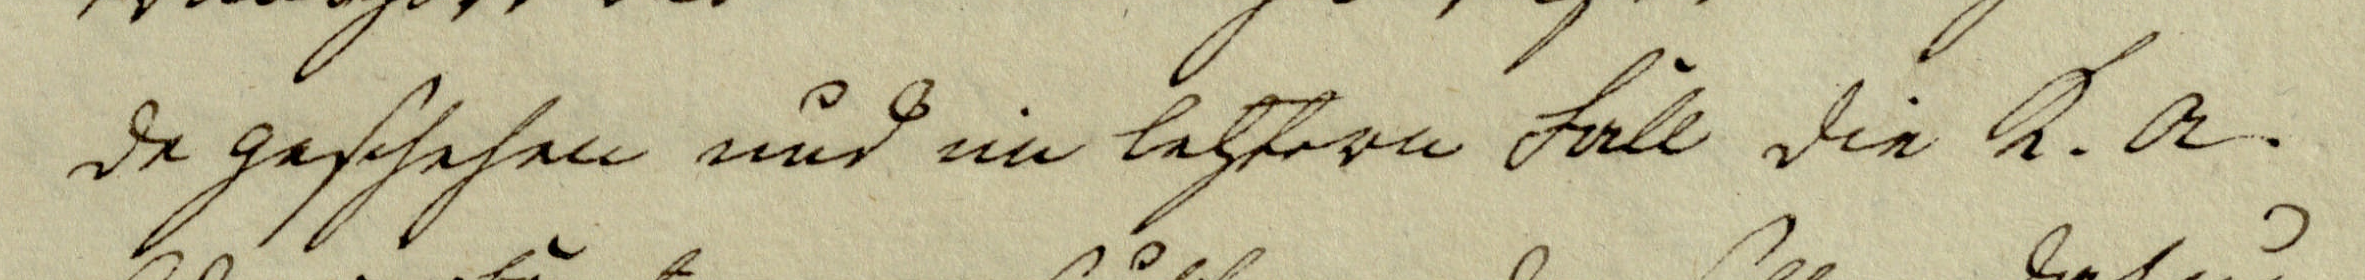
de geschehen und im letztern Fall die K. A.
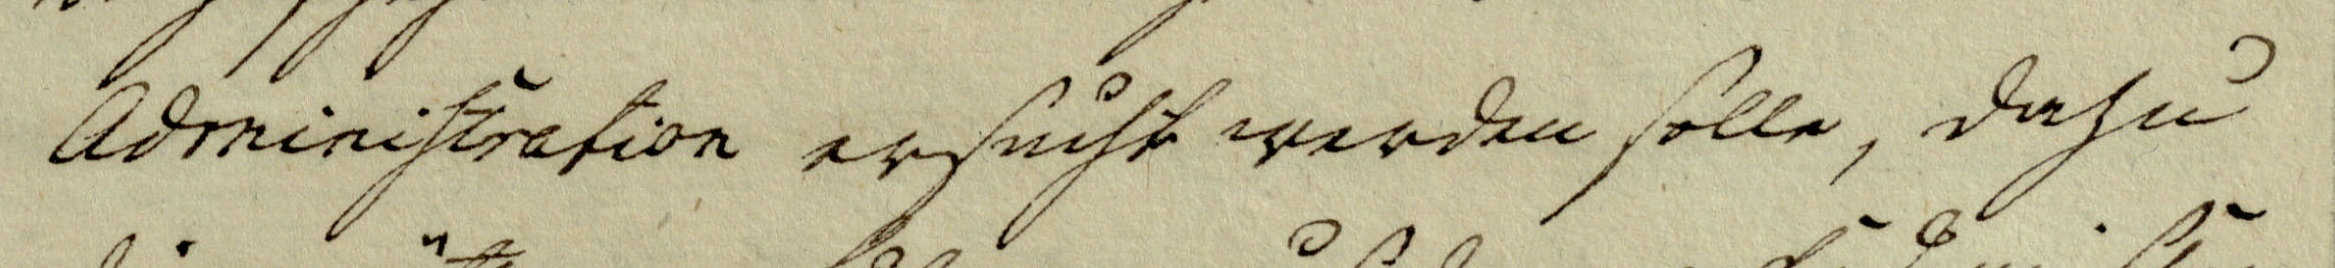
Administration ersucht werden solle, dazu
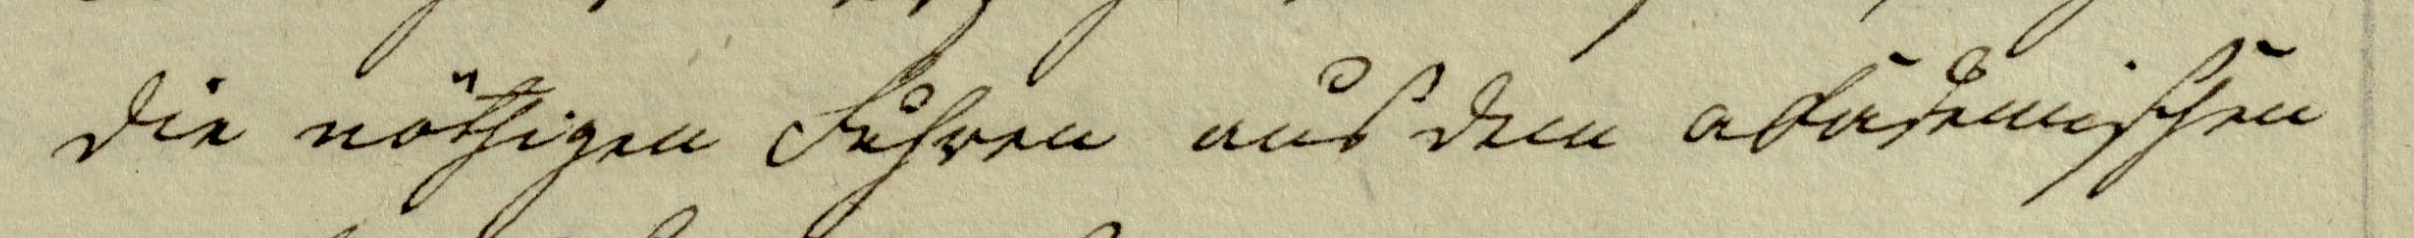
die nöthigen Fuhren aus dem akademischen
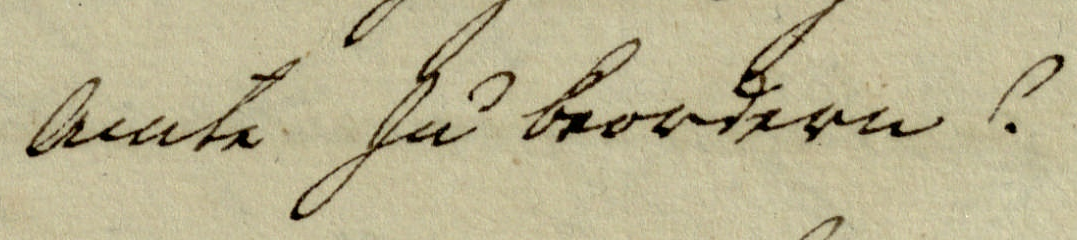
Amte zu beordern?
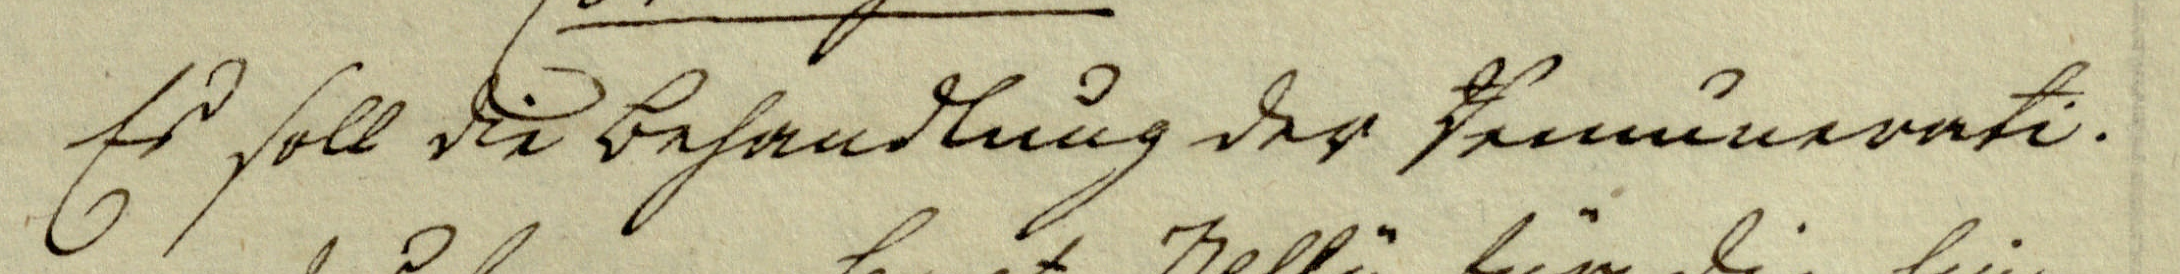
Es soll die Behandlung der Remunerati¬
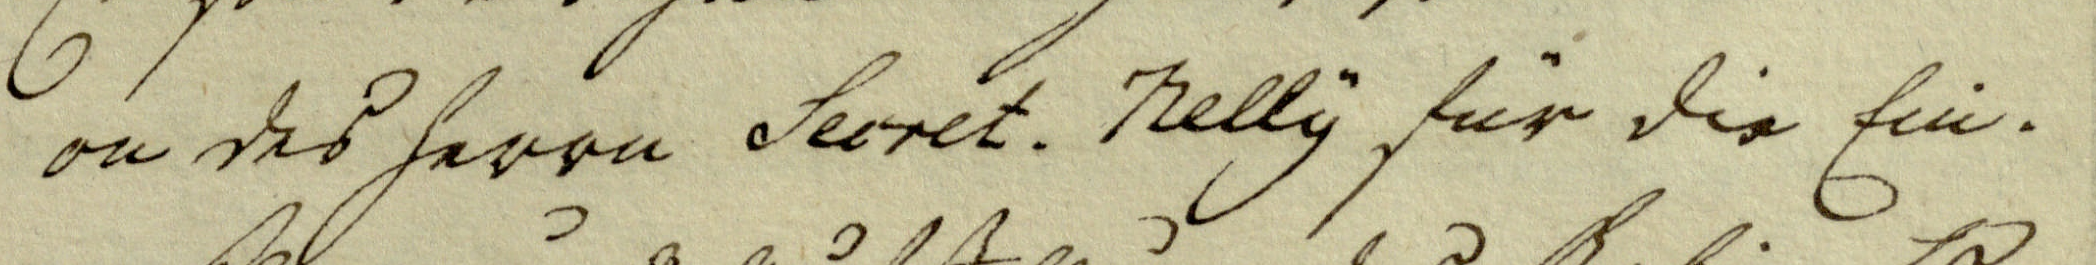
on des Herrn Secret. Nellÿ für die Ein¬
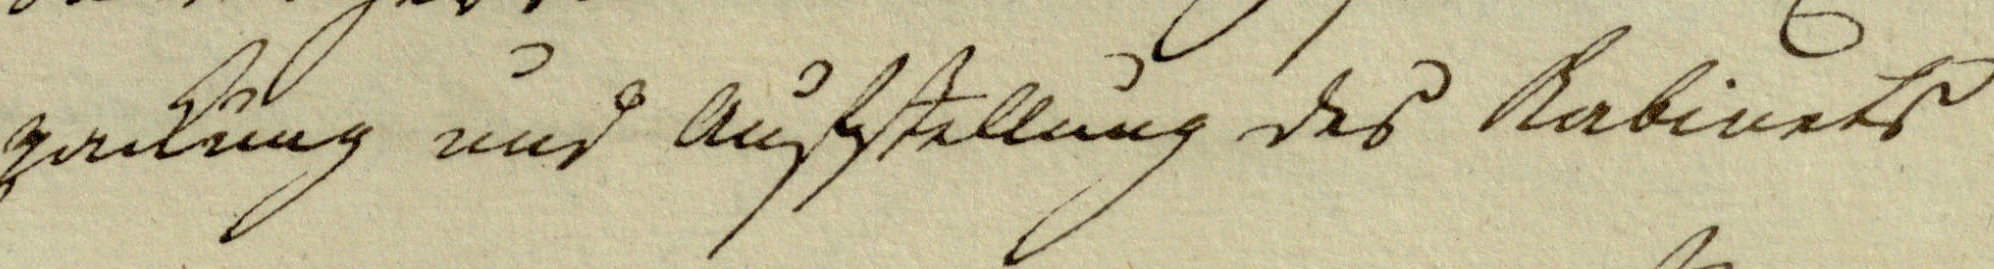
packung und Aufstellung des Kabinets
